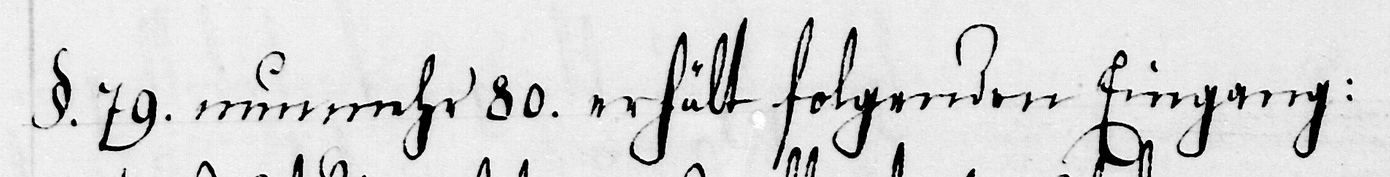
§. 79. nunmehr 80. erhält folgenden Eingang:
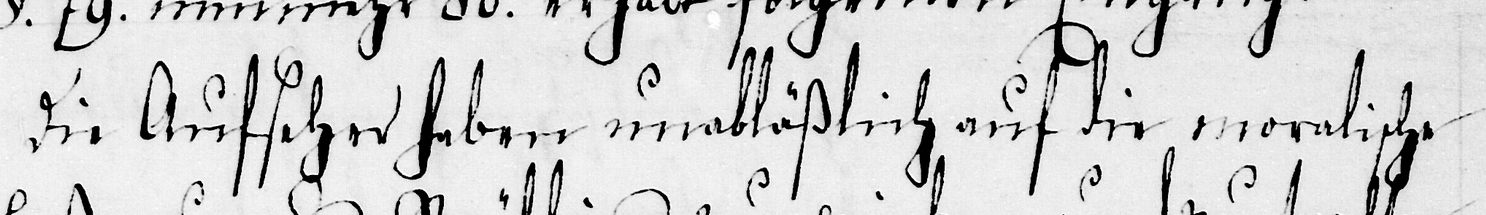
Die Aufseher haben unabläßlich auf die moralische
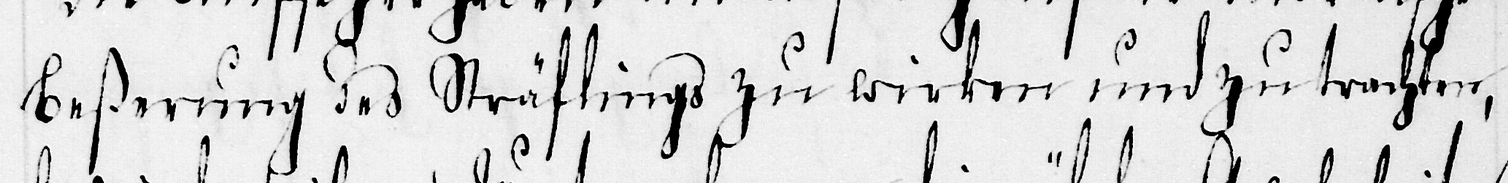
Beßerung des Sträflings zu wirken und zu trachten,
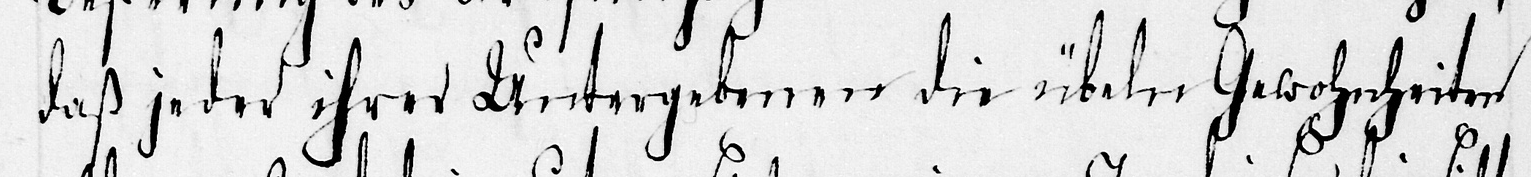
daß jeder ihrer Untergebenen die übeln Gewohnheiten
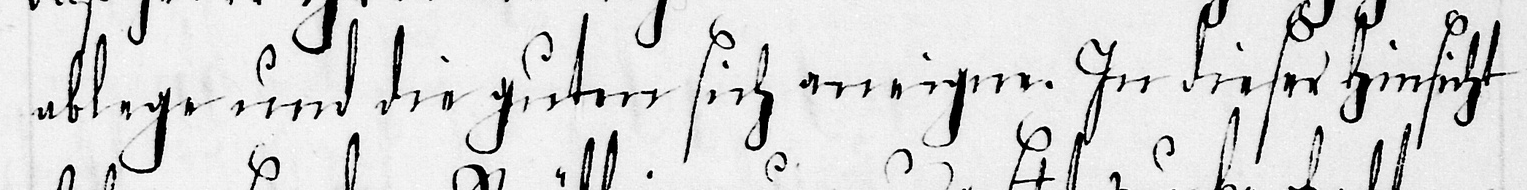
ablege und die guten sich aneigne. In dieser Hinsicht
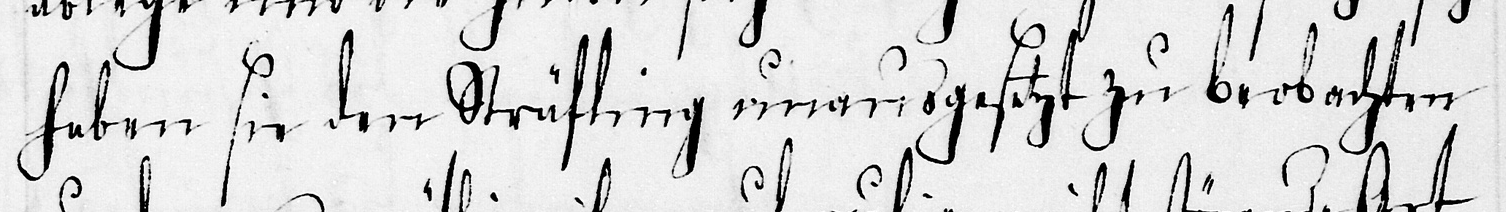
haben sie den Sträfling unausgesetzt zu beobachten
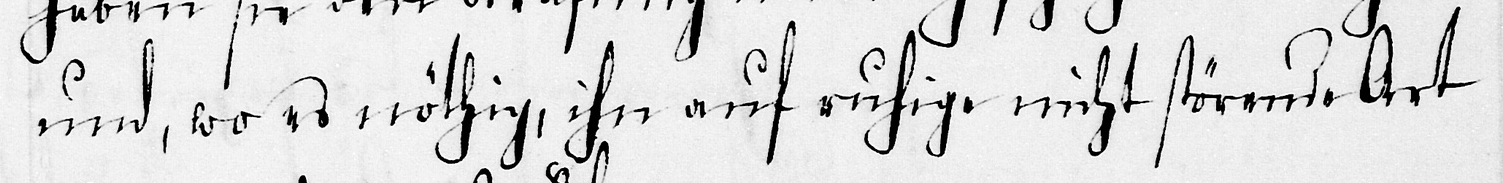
und, wo es nöthig, ihn auf ruhige nicht störende Art
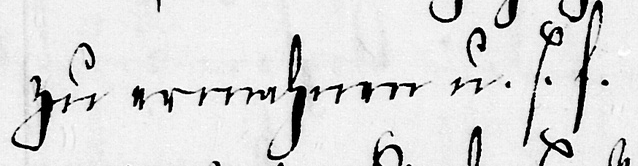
zu ermahnen u. s. f.
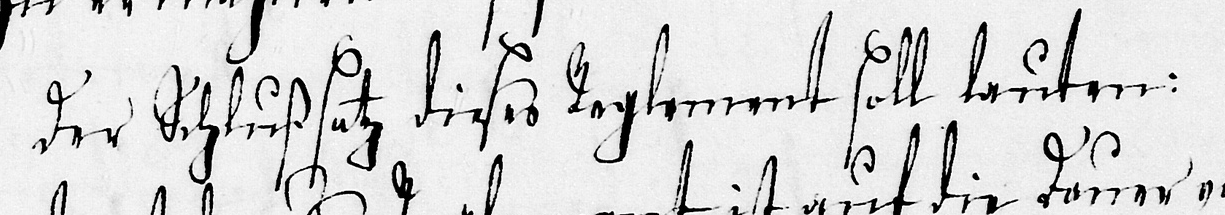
Der Schlußsatz dieses Reglement soll lauten:
